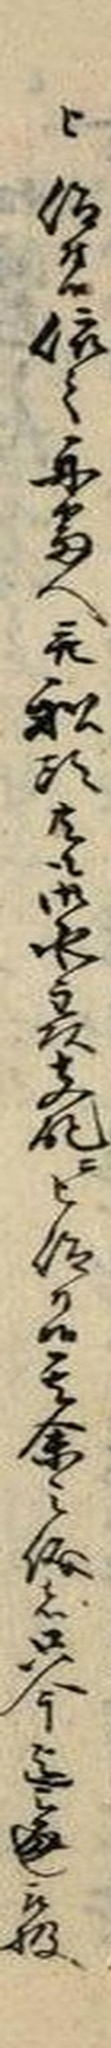被仰付候依之舟番人并船頭共も御水主頭支配に被仰付候其余之儀は只今迄之通取扱
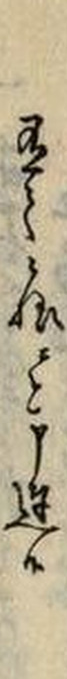有之候様にと申達候
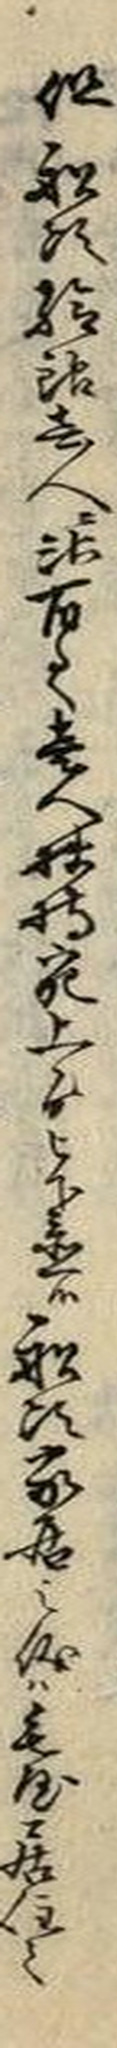但船頭給銀壱人に銀百匁壱人扶持宛上ゟ被下置候船頭家居之儀は毛屋居住之
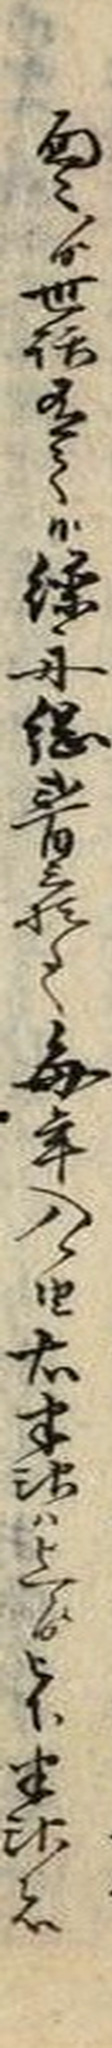面々ゟ世話有之候繰舟綱弐百三拾匁毎年入候由右半銀は上ゟ被下半銀は
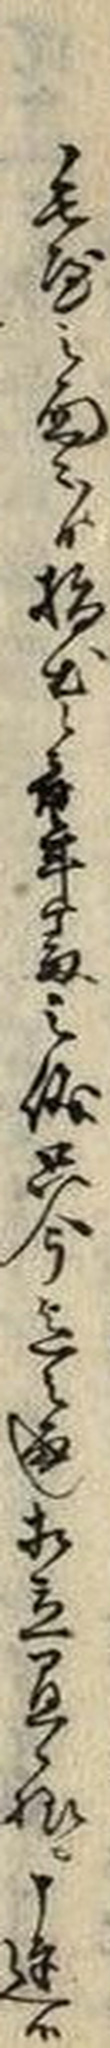毛屋之面々ゟ指出候に付年番之儀只今迄之通相立置候様に申達候
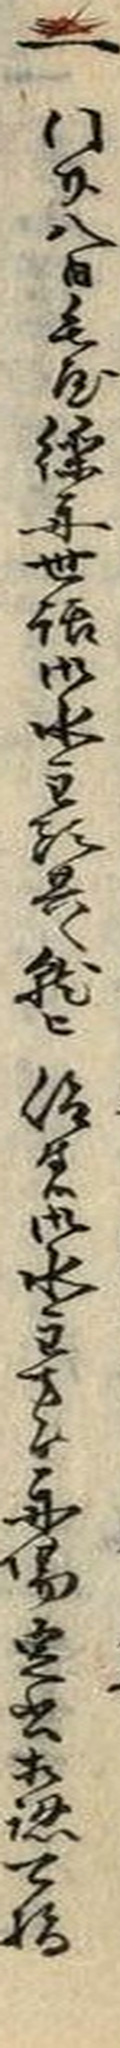一同廿八日毛屋繰舟世話御水主頭共へ就被仰付候御水主方ゟ舟場定書相認可指
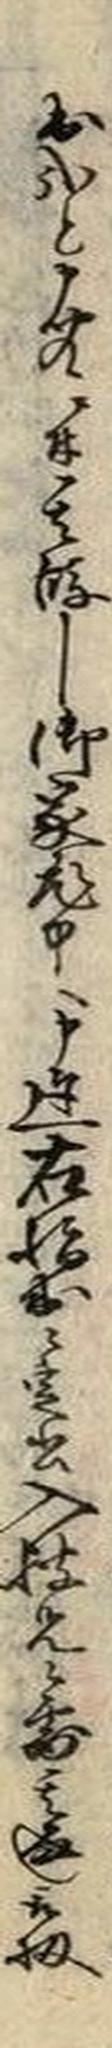出哉と申聞候に付其余之御家老中へ申達右指出候定書入披見候処其通取扱
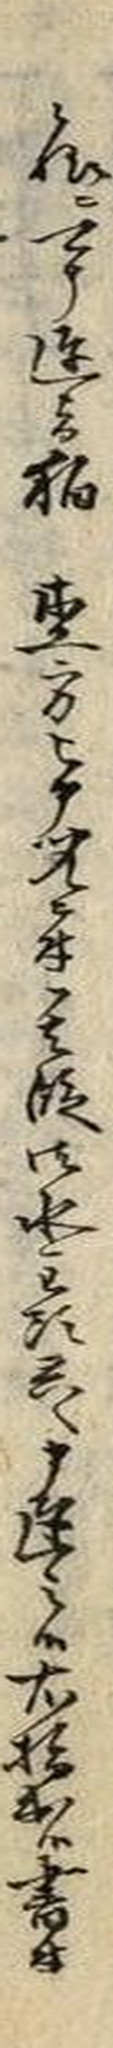候様に可申達旨狛杢方被申聞候に付其段御水主頭共へ申達之候右指出候書付
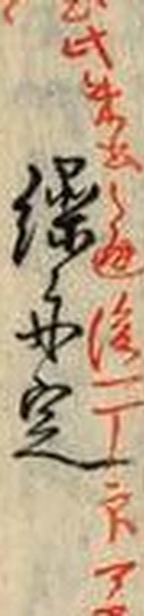繰舟定
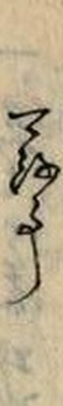可致事

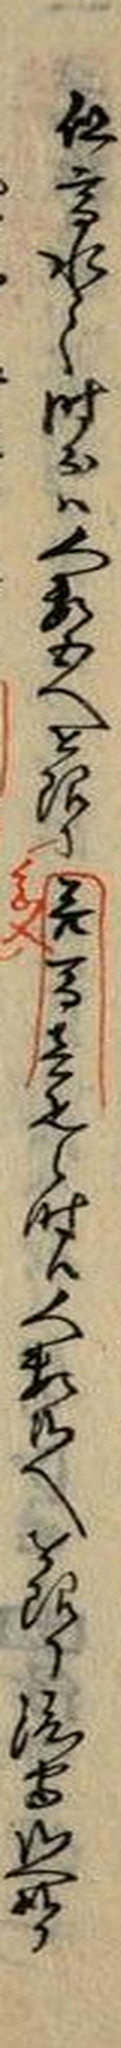但高水之時分は人数五人を限り并馬壱疋之時は人数弐人を限り渡守弐人掛り
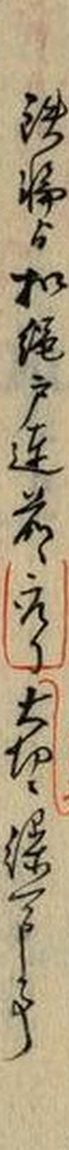鉄輪ゟ控縄戸連前へ取り念入大切に繰可申事
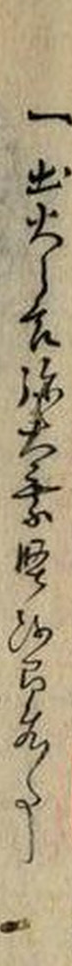一出火之節弥大乗堅致間敷事
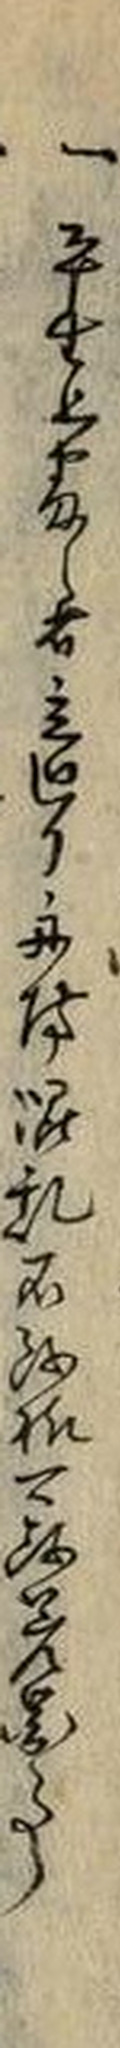一平生上番之者立廻り舟場混乱不致様可致差図事
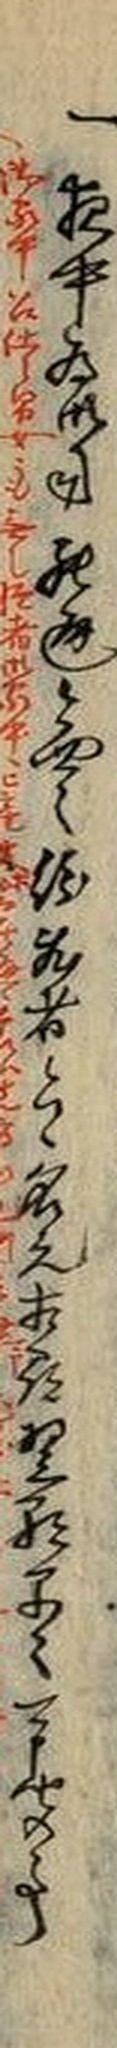一夜中為御用罷通候面々紛敷者候はゝ名元相尋翌朝早々可申聞事
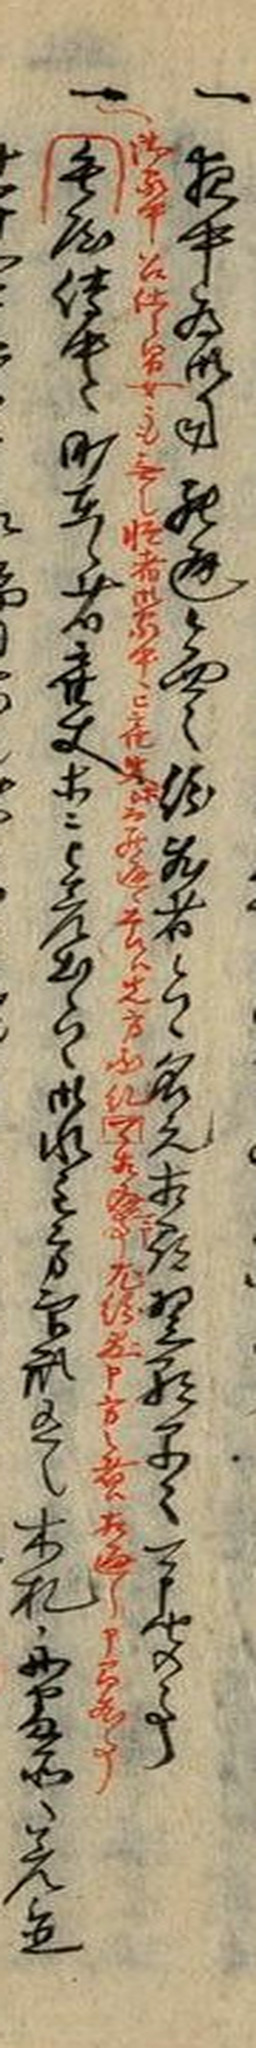毛屋侍中へ町在之者雇使等に被差出候はゝ御水主方印形有之木札舟番所へ差置
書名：御城下諸事之部
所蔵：福井県文書館 Fukui Prefectural Archives
